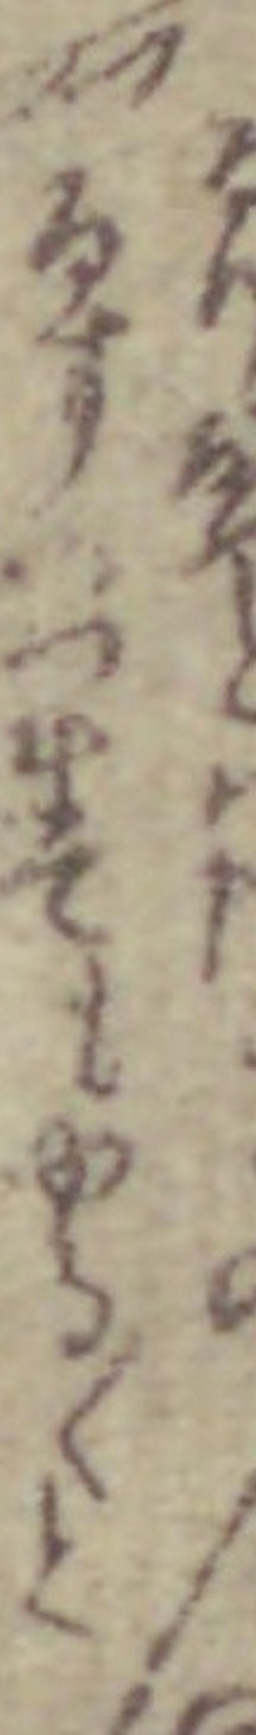るすいつまてもゆる〳〵と
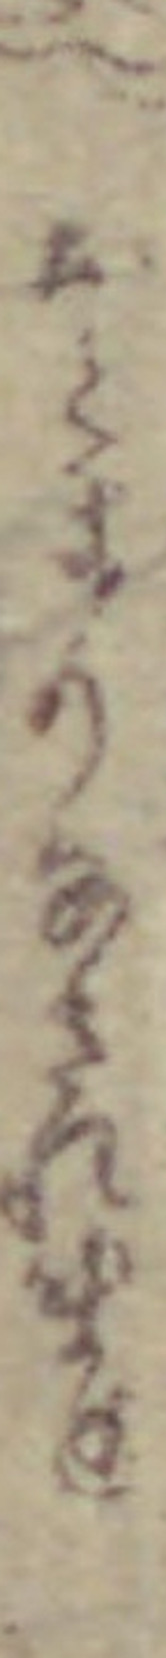とまりなされませ

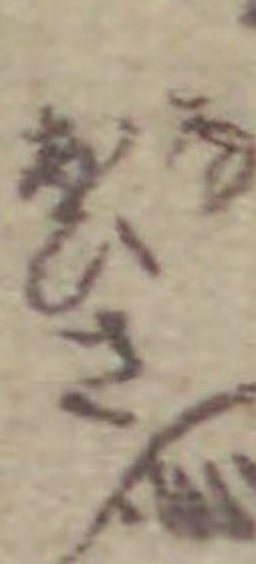おひさ
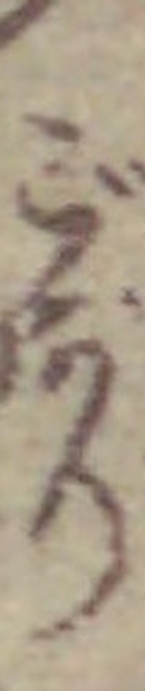ごさり

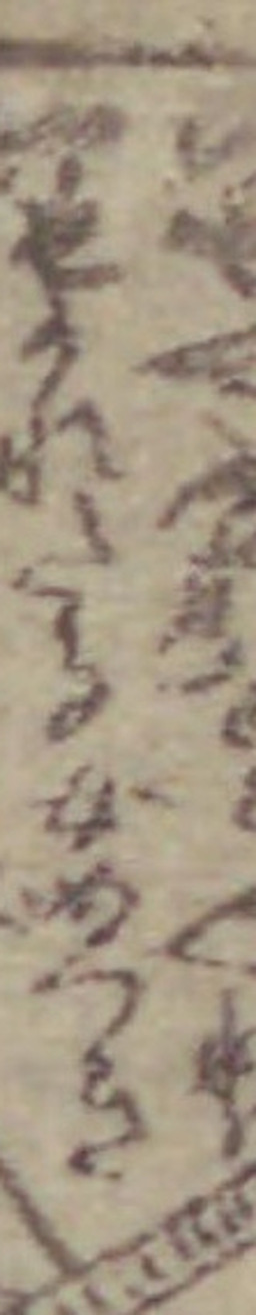やせかれたる女めつき
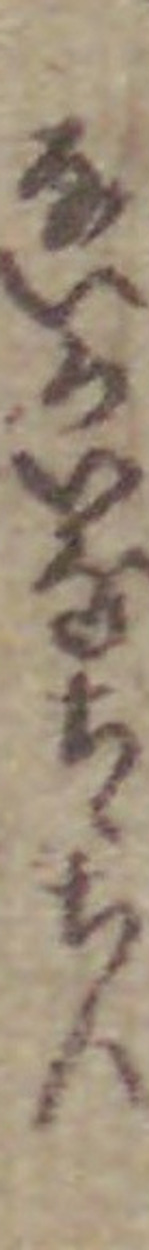ないかいなちゝちん
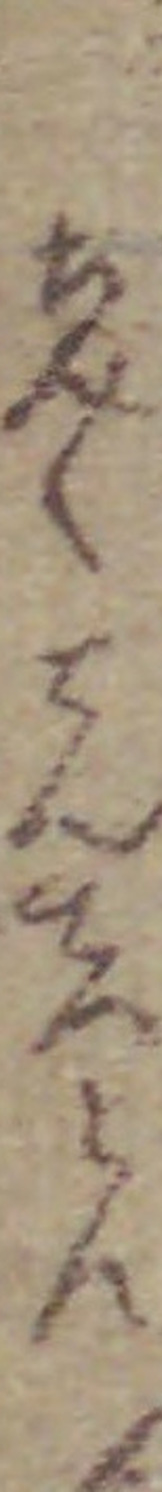ちん〳〵てんてつとん

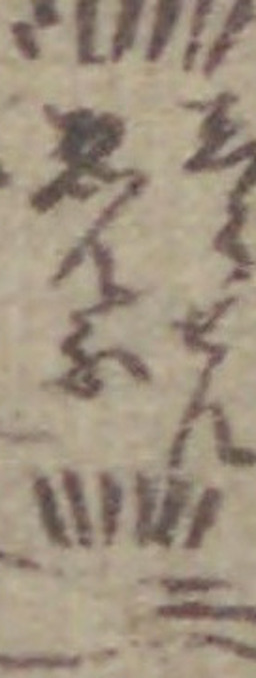ゑんふ
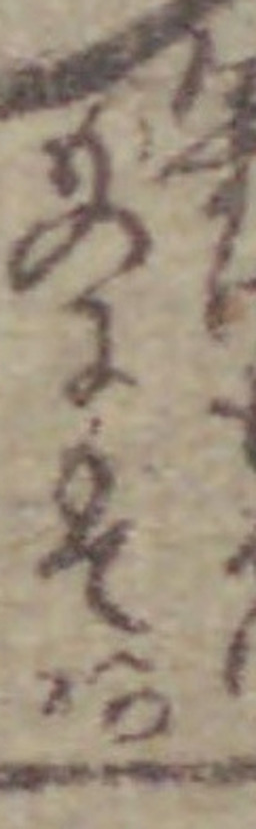ものにもてあ
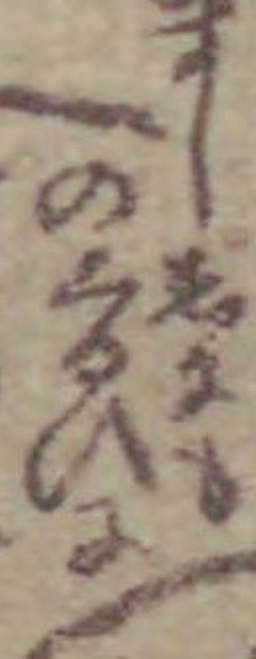のくるひに
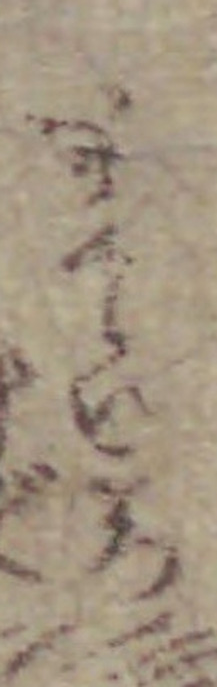いまくらいころ
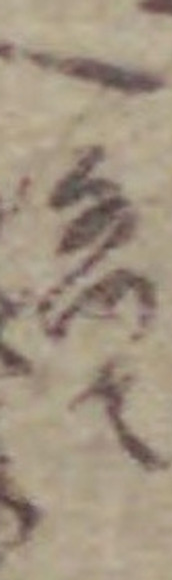なつて
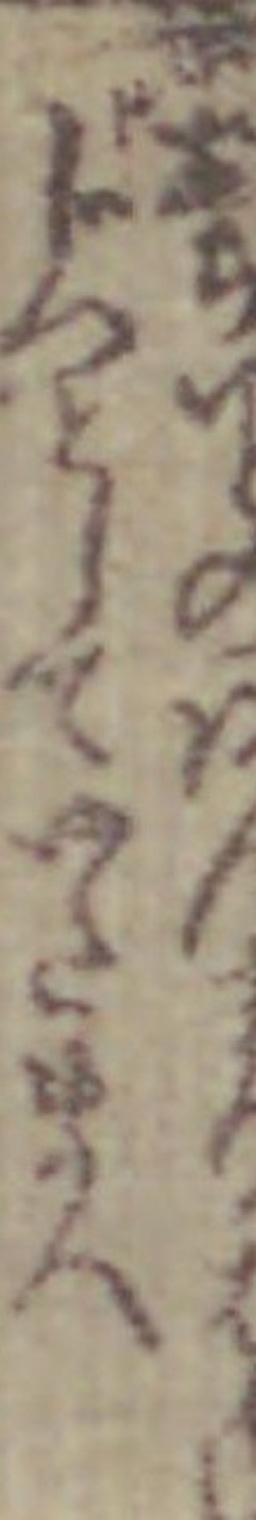じつとしていたまへ

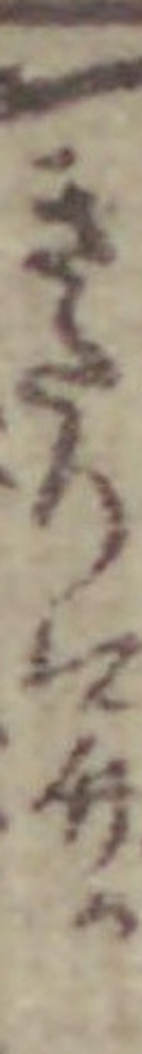きたり郷介か
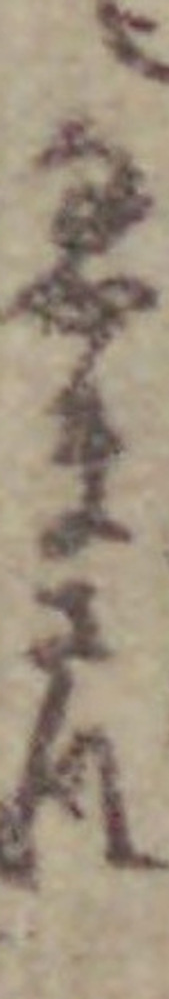なやまされ
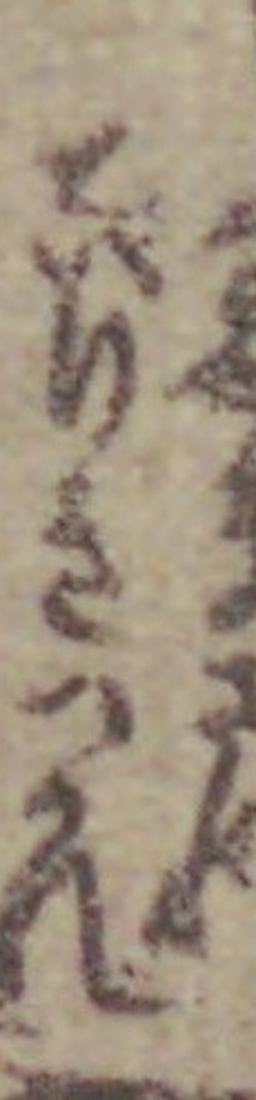ていりきつかれ
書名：化物一家髭女 2巻
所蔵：国立国会図書館 National Diet Library, JAPAN
